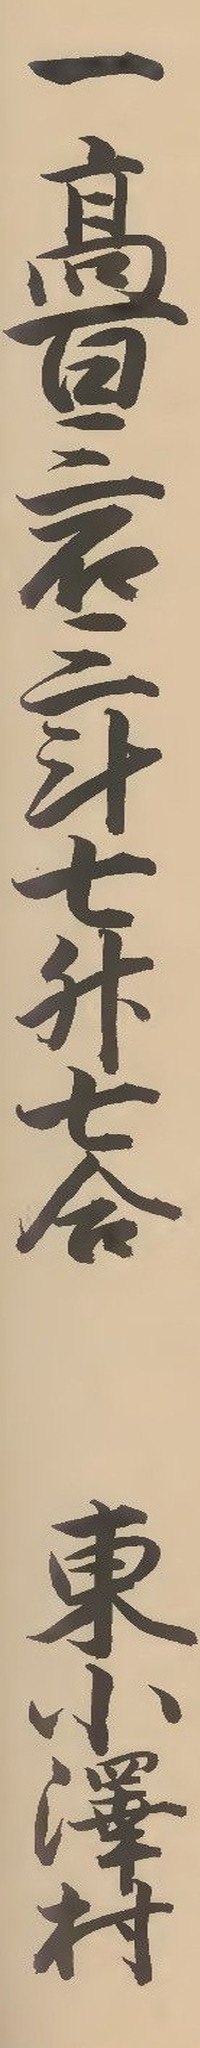一髙百三石三斗七升七合東小澤村
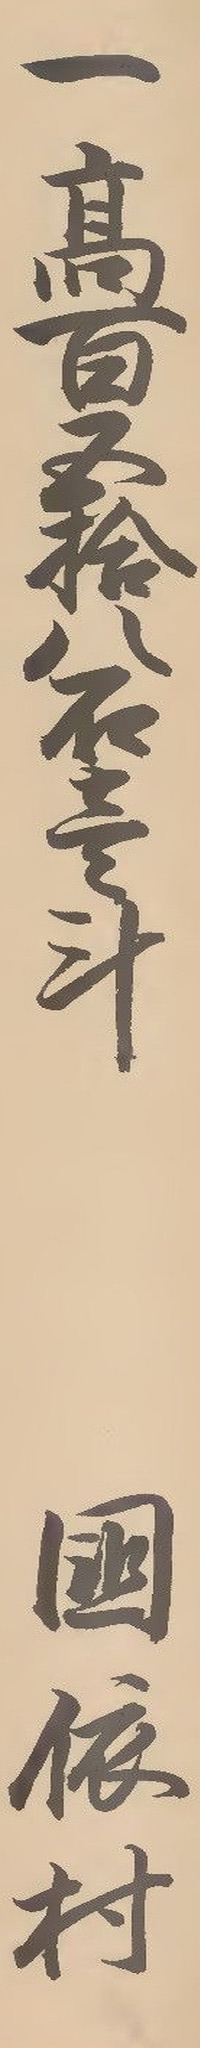一髙百五拾八石壱斗國依村
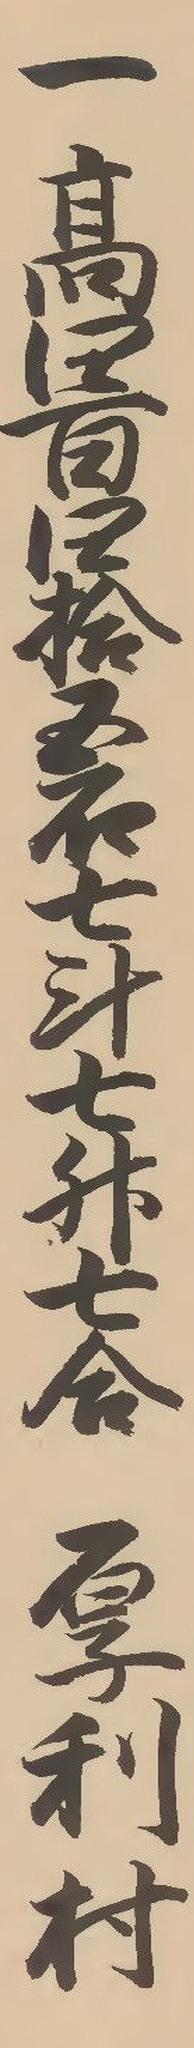一髙四百四拾五石七斗七升七合厚利村
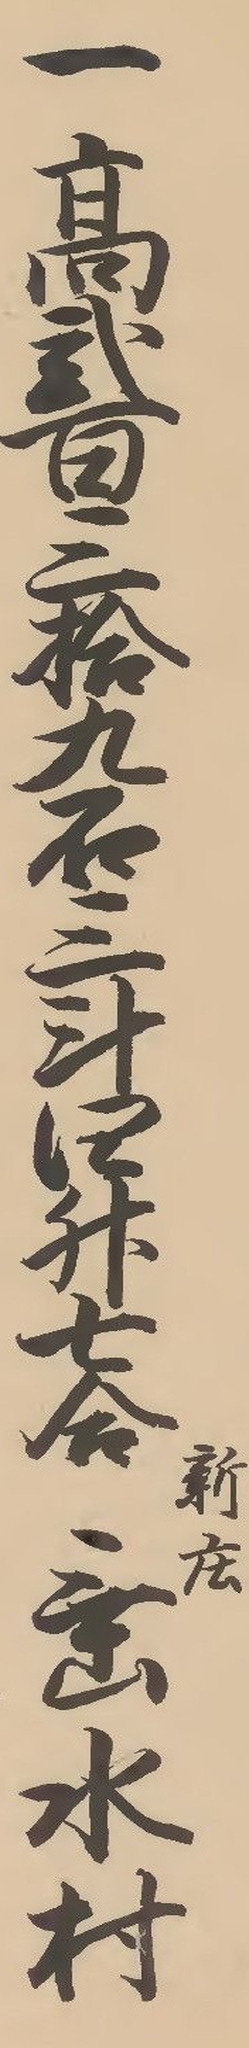一髙弐百三拾九石三斗四升七合垂水村
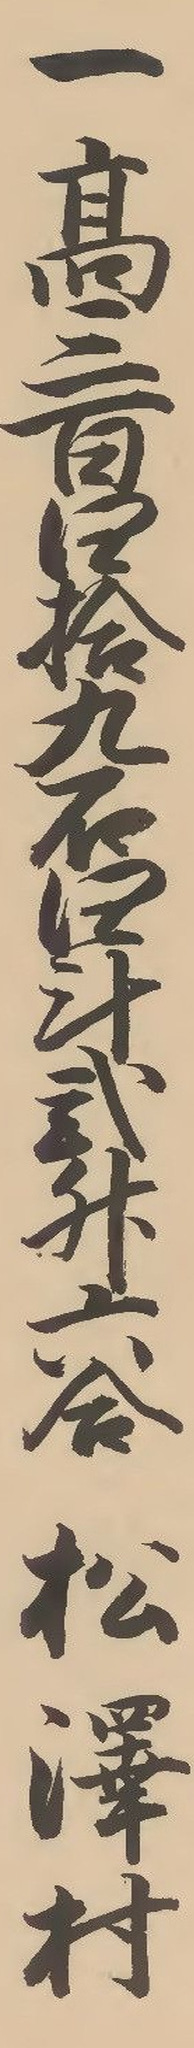一髙三百四拾九石四斗弐升六合松澤村

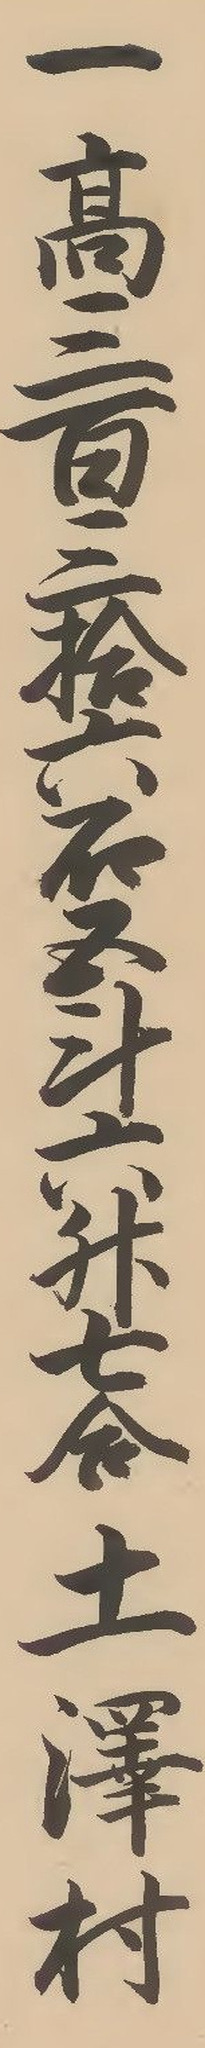一髙三百三拾六石五斗六升七合土澤村
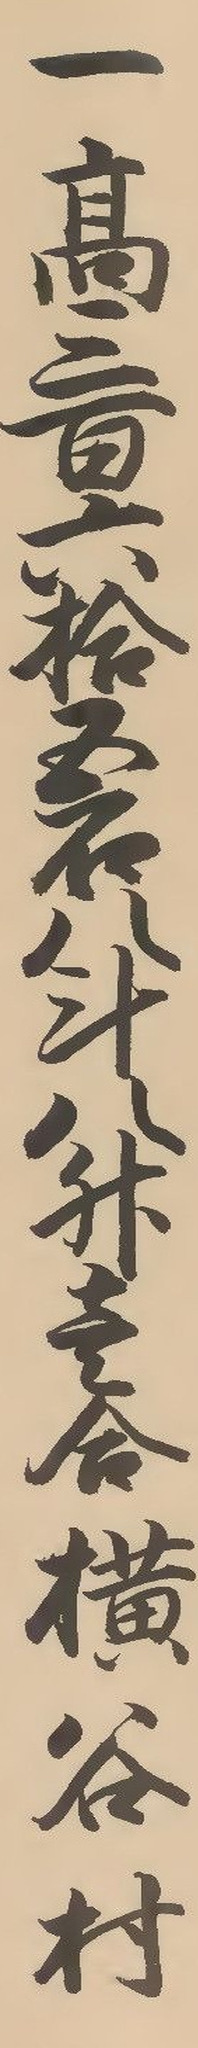一髙三百六拾五石八斗八升壱合横谷村
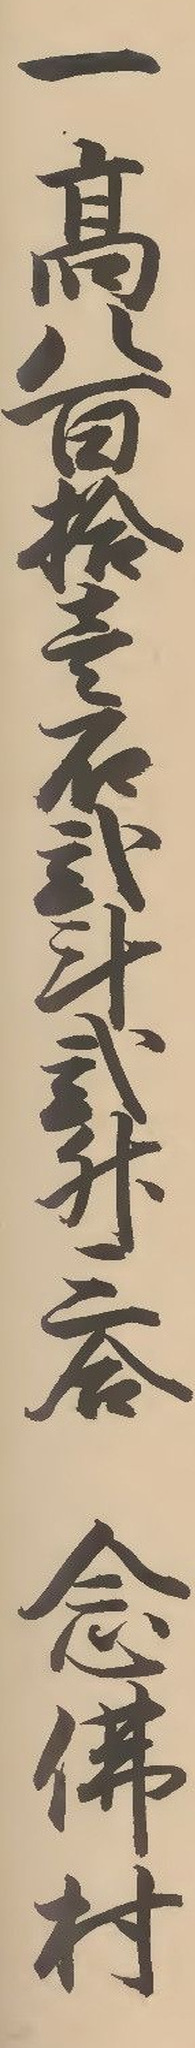一髙八百拾壱石弐斗弐升三合念佛村
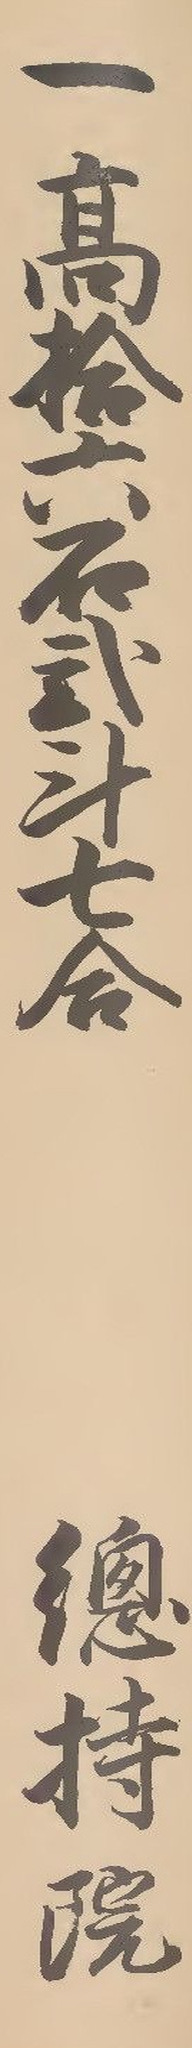一髙拾六石弐斗七合聰持院
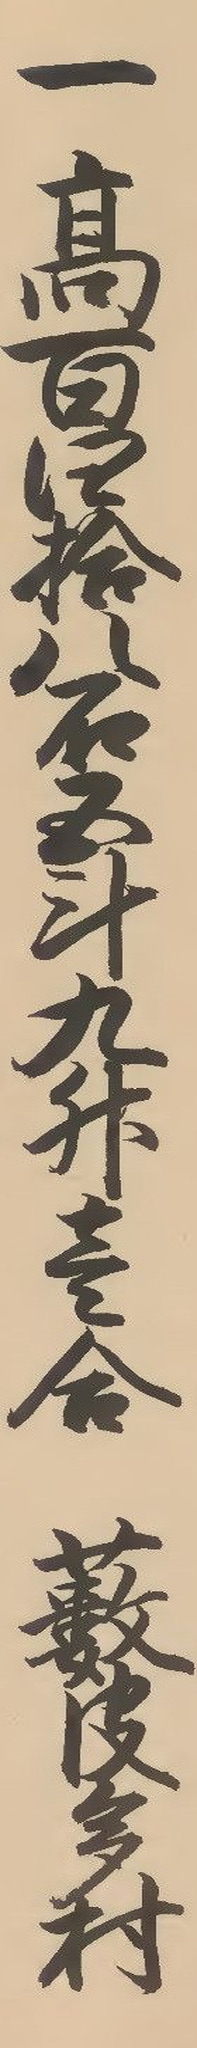一髙百四拾八石五斗九升壱合藪皮多村
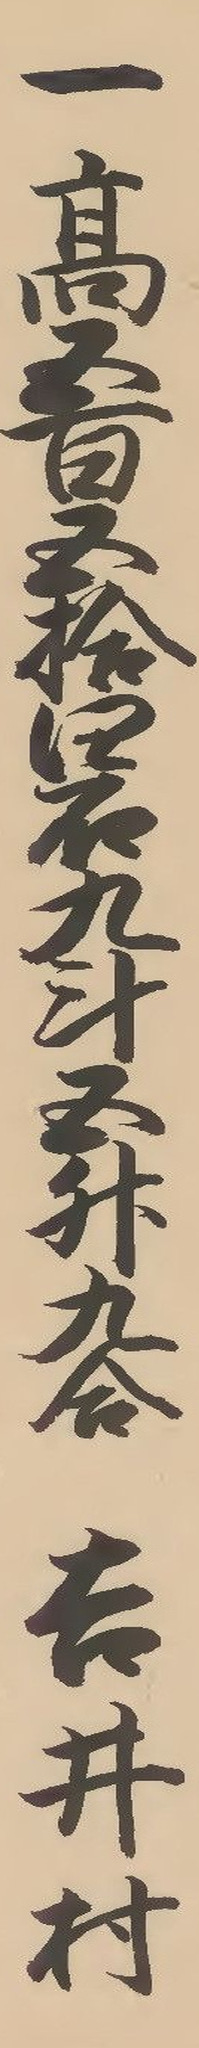一髙五百五拾四石九斗五升九合吉井村
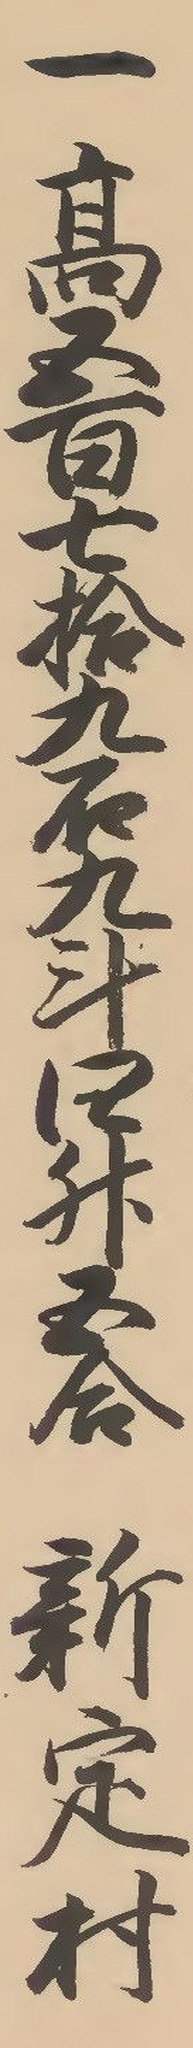一髙五百七拾九石九斗四升五合新定村

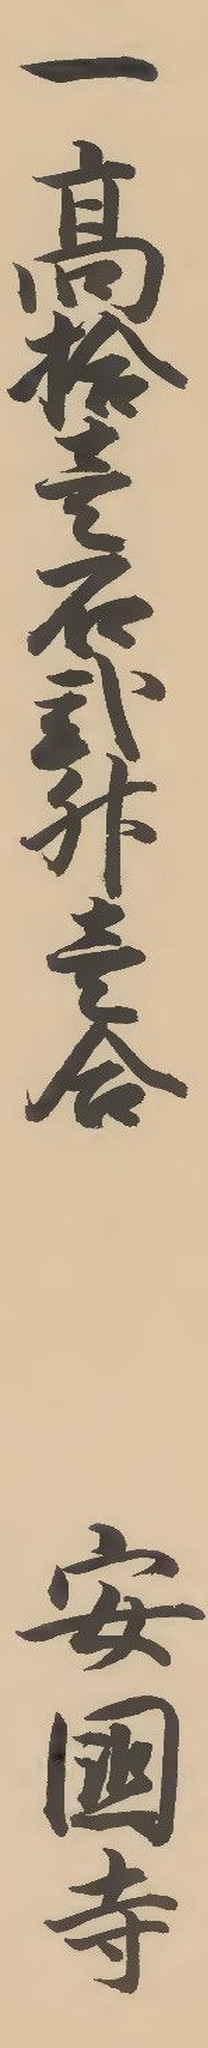一髙拾壱石弐升壱合安國寺
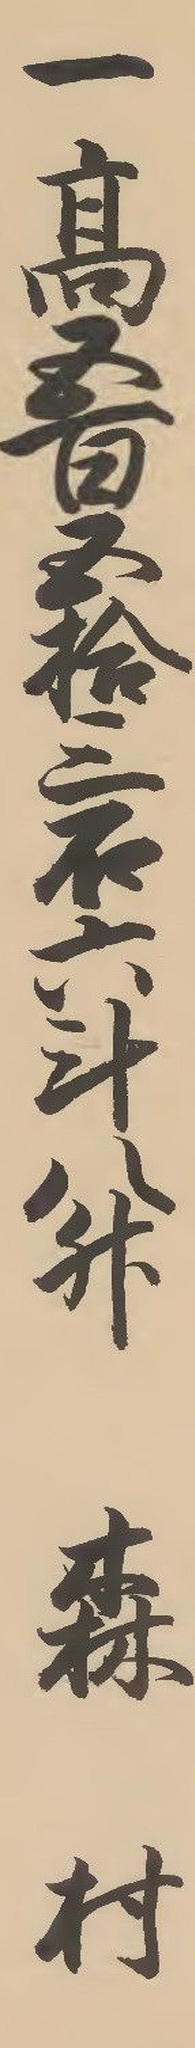一髙五百五拾三石六斗八升森村
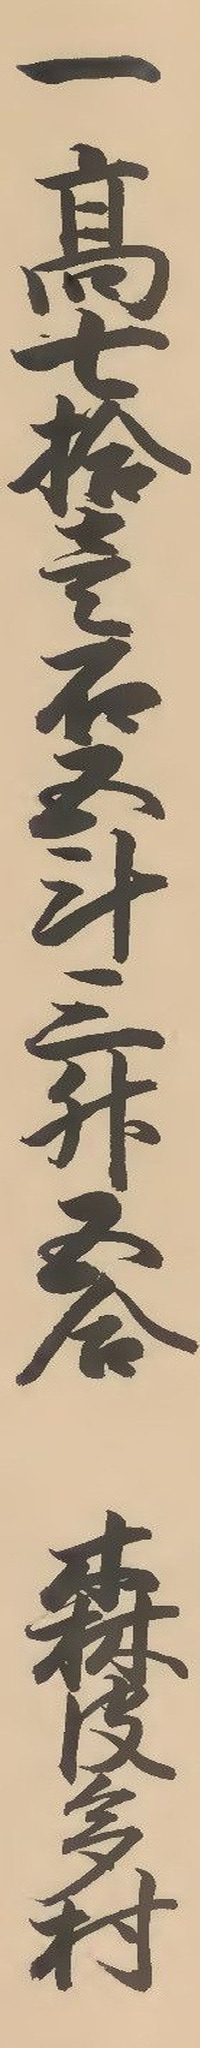一髙七拾壱石五斗三升五合森皮多村
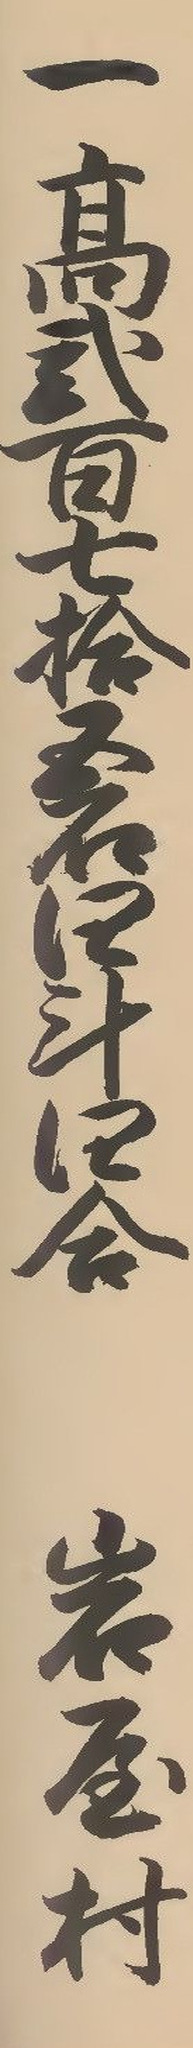一髙弐百七拾五石四斗四合岩屋村
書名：播磨国郷帳
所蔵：国立公文書館 National Archives of Japan
